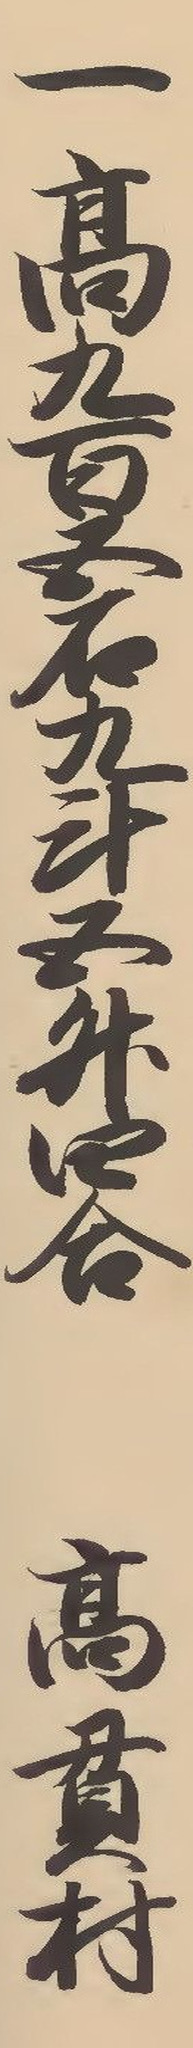一高九百五石九斗五升四合高貫村
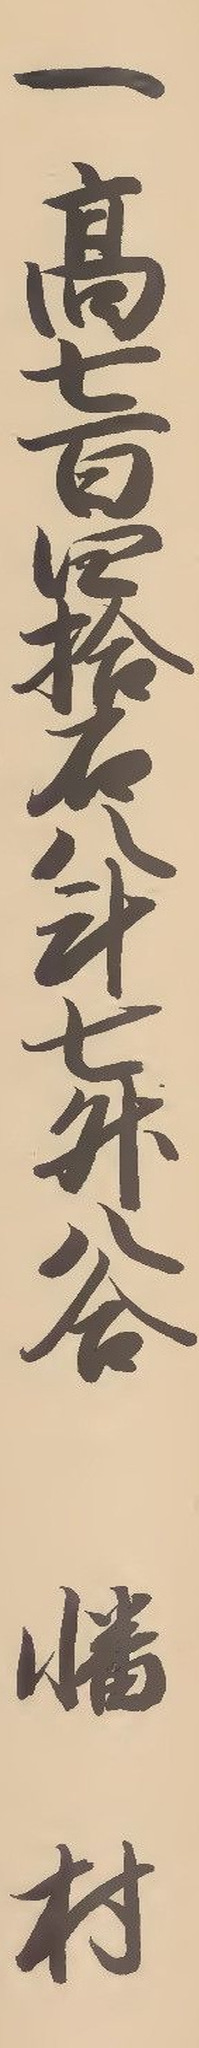一高七百四拾石八斗七升八合幡村
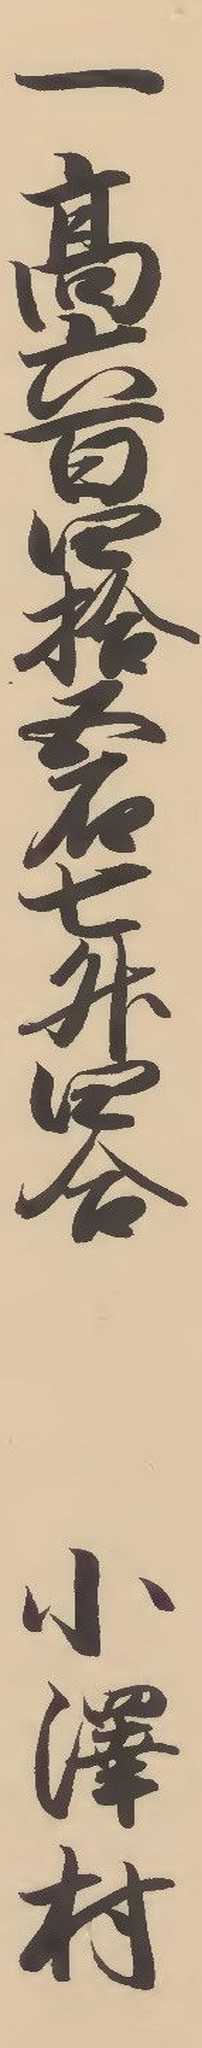一高六百四拾五石七升四合小沢村
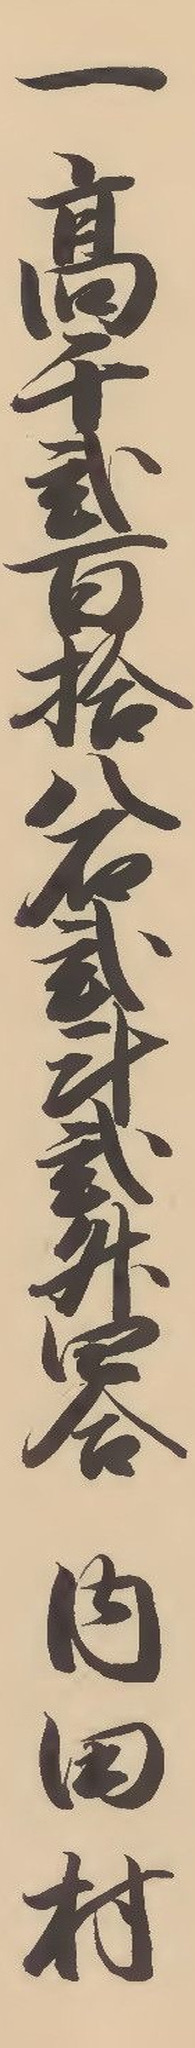一高千弐百拾八石弐斗弐升四合内田村
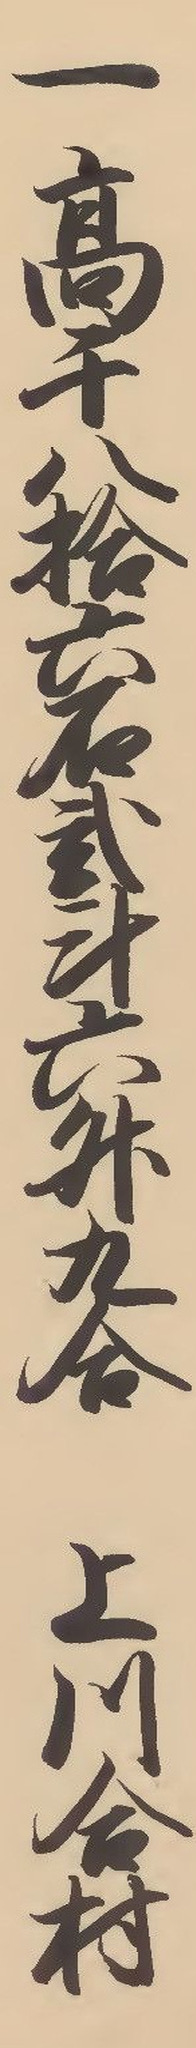一高千八拾六石弐斗六升九合上川合村

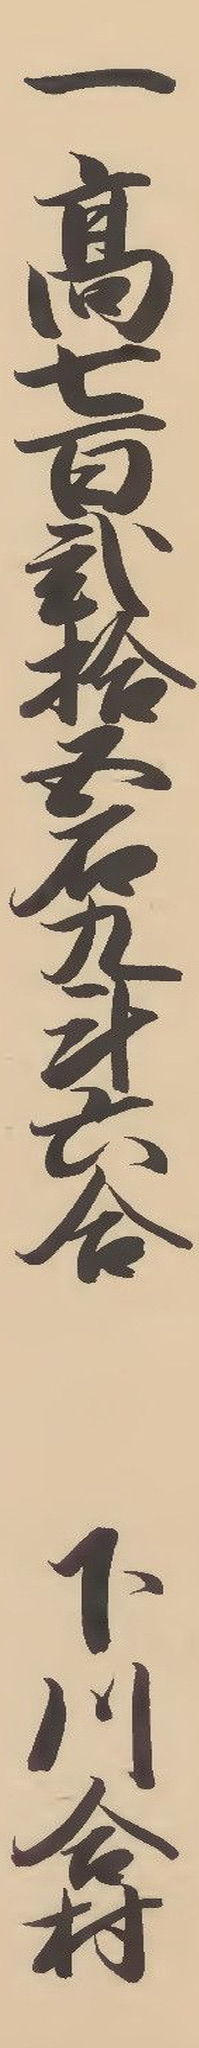一高七百弐拾五石九斗六合下川合村
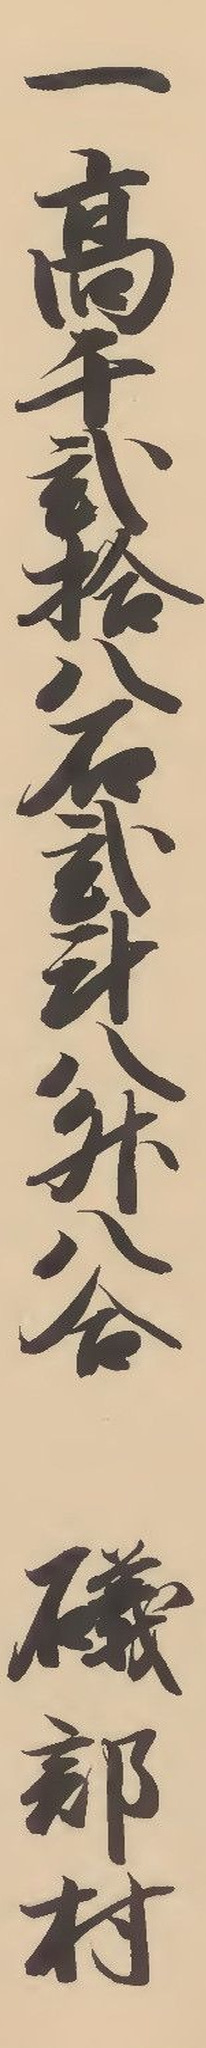一高千弐拾八石弐斗八升八合磯部村
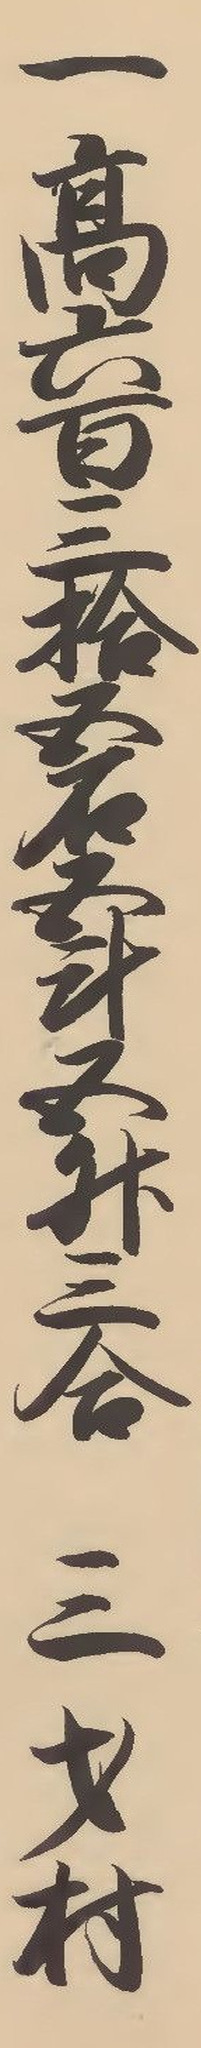一高六百三拾五石五斗五升三合三才村
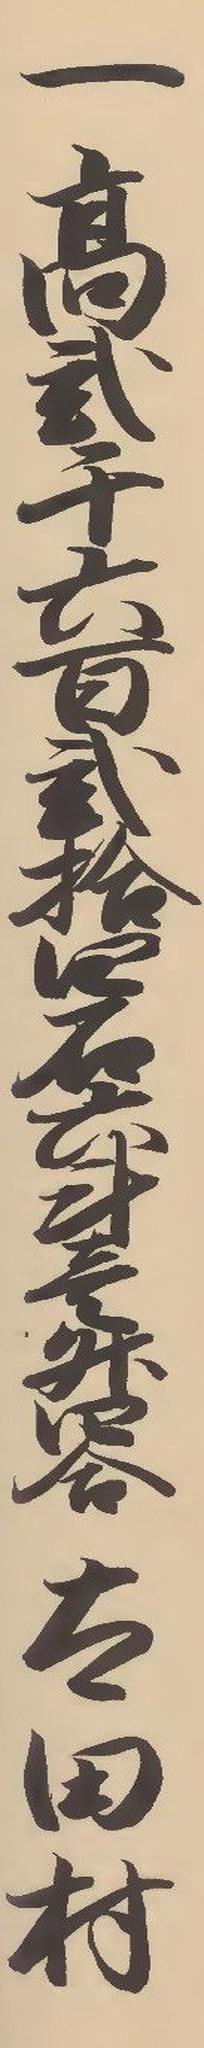一高弐千六百弐拾四石六斗壱升四合太田村
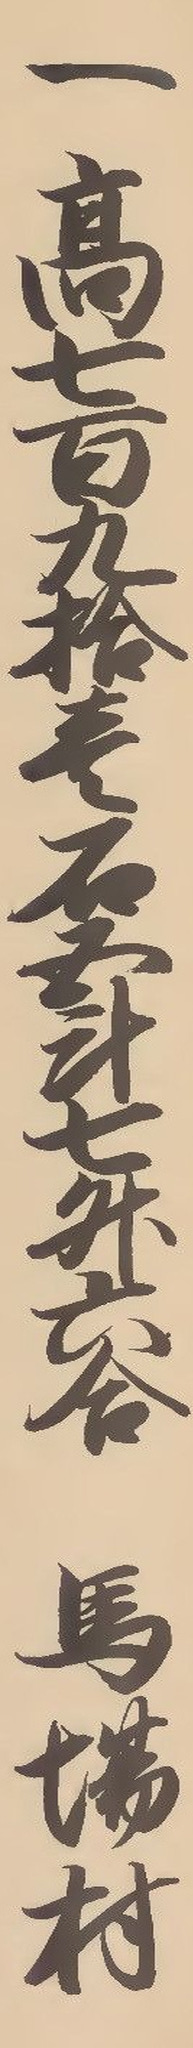一高七百九拾壱石五斗七升六合馬場村
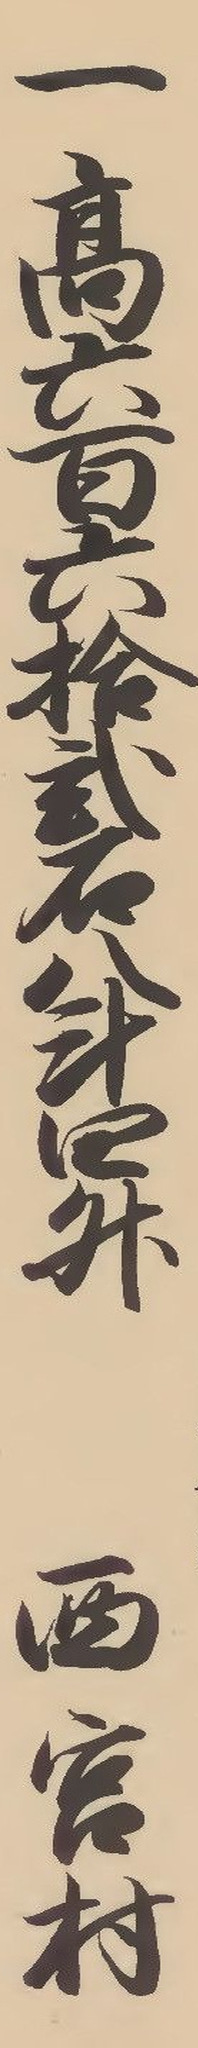一高六百六拾弐石八斗四升西宮村
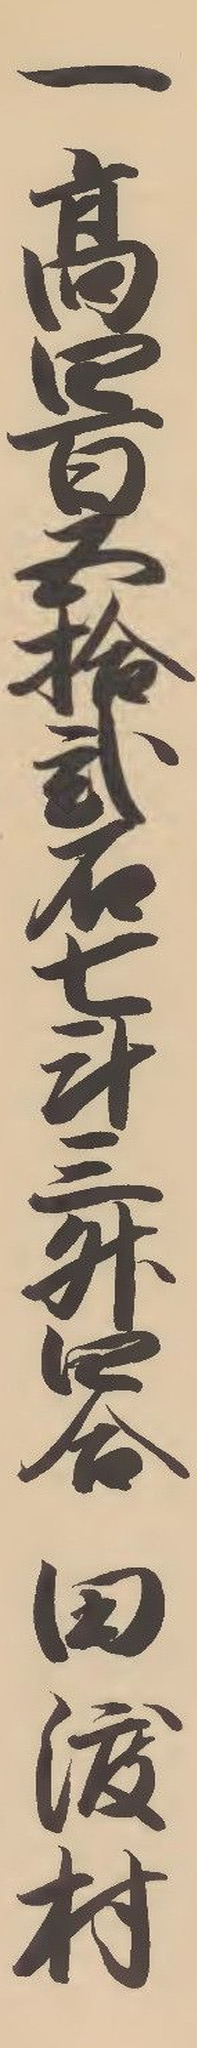一高四百五拾弐石七斗三升四合田渡村
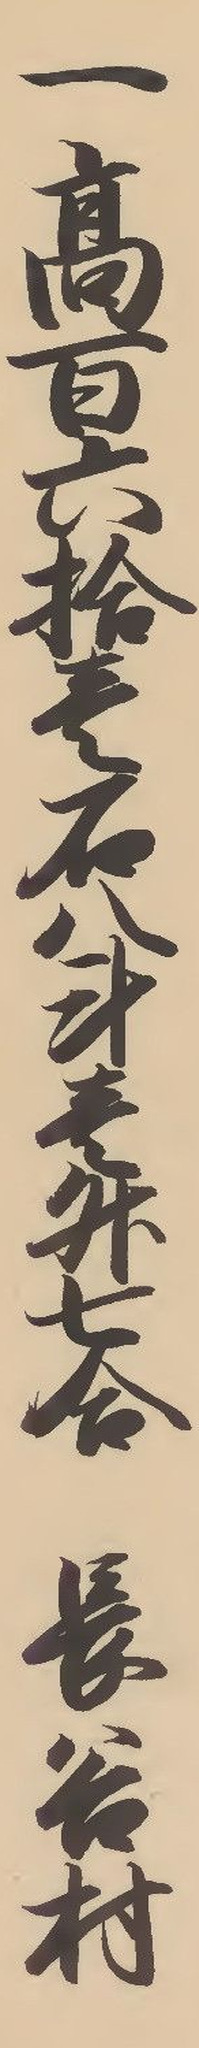一高百六拾壱石八斗壱升七合長谷村

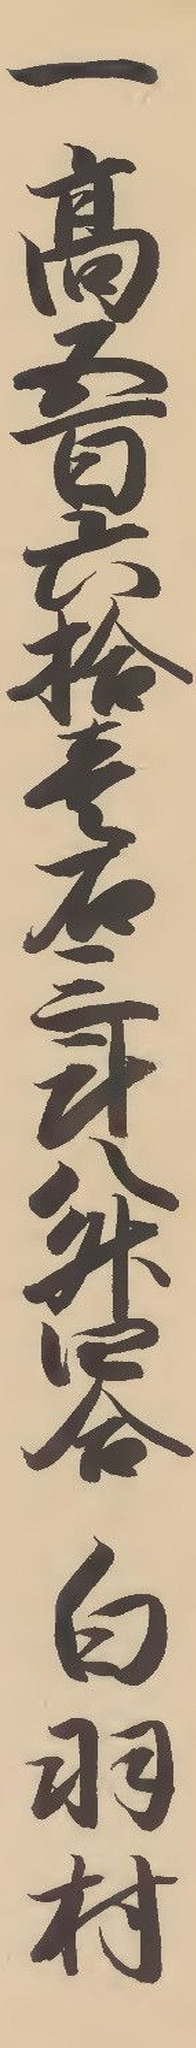一高五百六拾壱石三斗八升四合白羽村
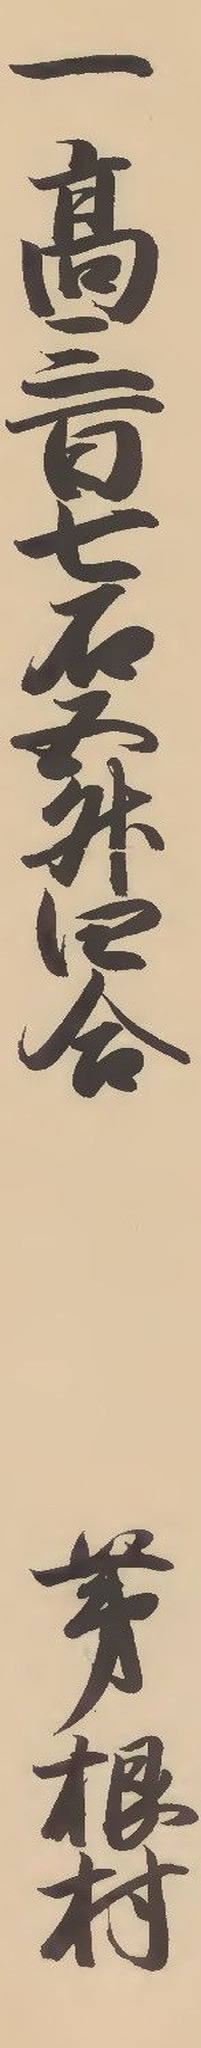一高三百七石五升四合茅根村
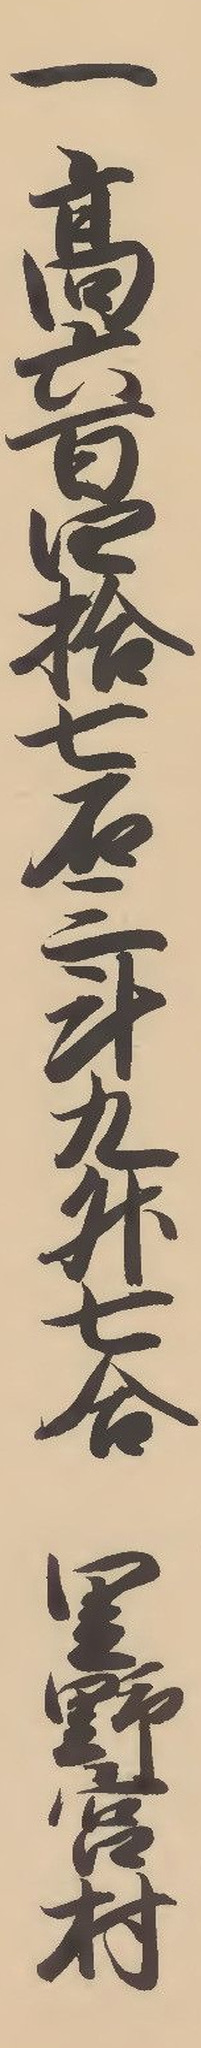一高六百四拾七石三斗九升七合里野宮村
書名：常陸国郷帳
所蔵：国立公文書館 National Archives of Japan
